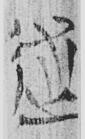述
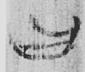曰
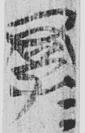君
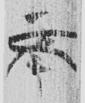不
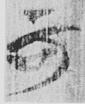可
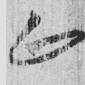㠯（以）
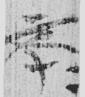不不
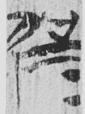強強
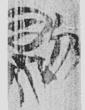則
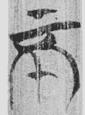不
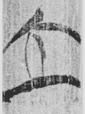立
